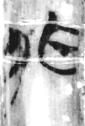非
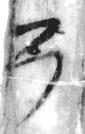乃
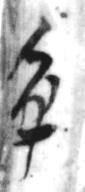引
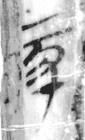亥
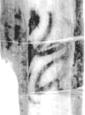朝
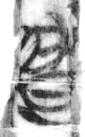閟（閉）
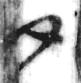夕
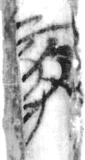啟
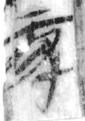亥
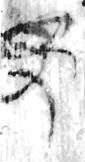𠭁
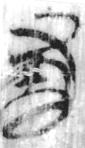晝
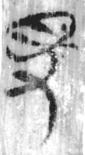○（得）
